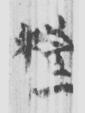{木㞷}
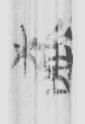{木甫}
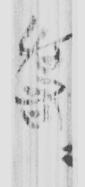{左右}=
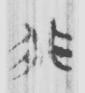非
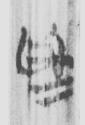爲
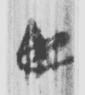臣
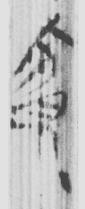賜
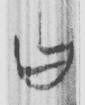曰
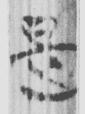是
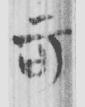可
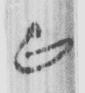㠯（以）
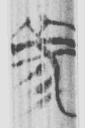羕
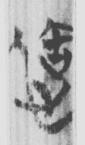{人缶心}
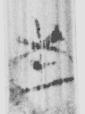{木土}
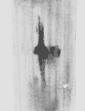七
